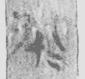九十=
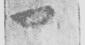四
